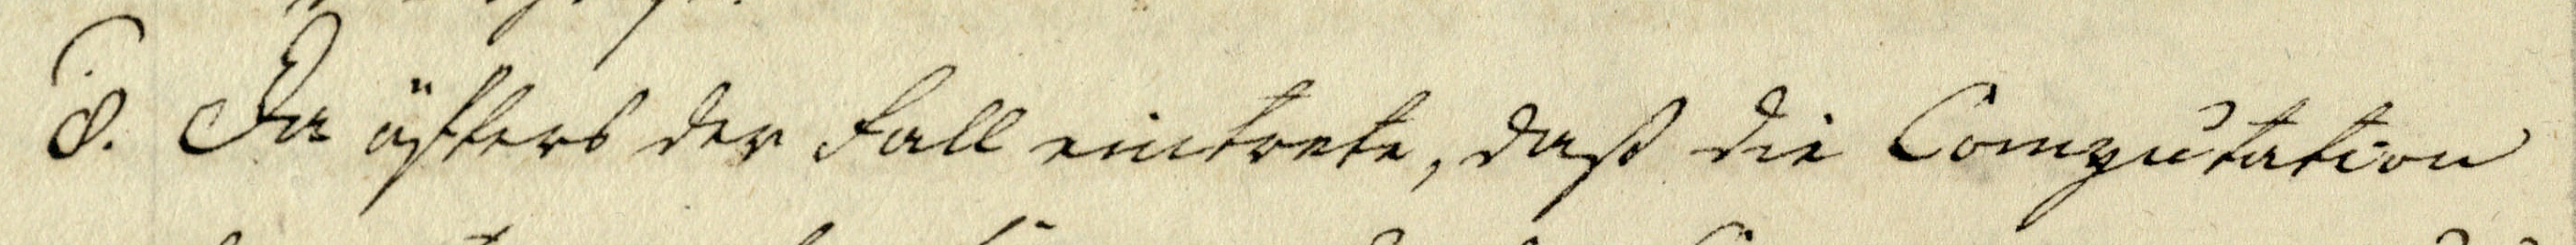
8. Da öfters der Fall eintrete, daß die Computation
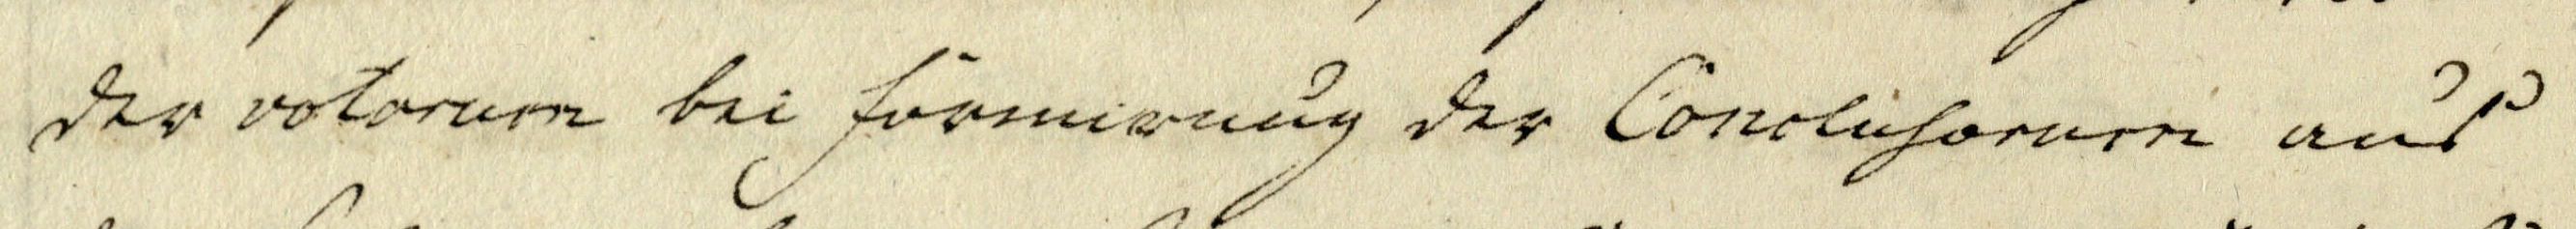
der votorum bei formirung der Conclusorum aus
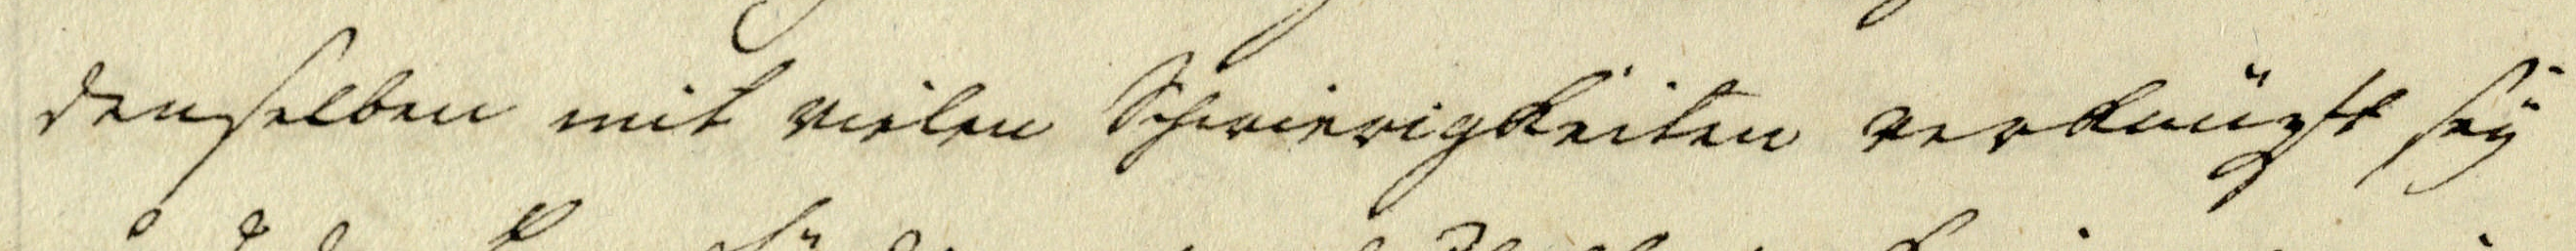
denselben mit vielen Schwierigkeiten verknüpft seÿ
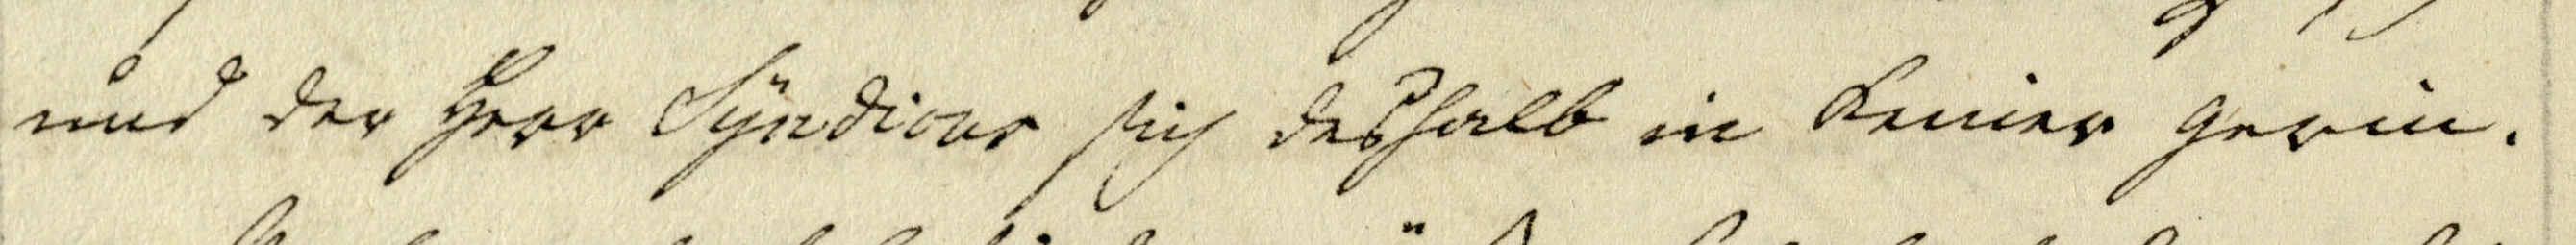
und der Herr Sÿndicus sich deshalb in keiner gerin¬
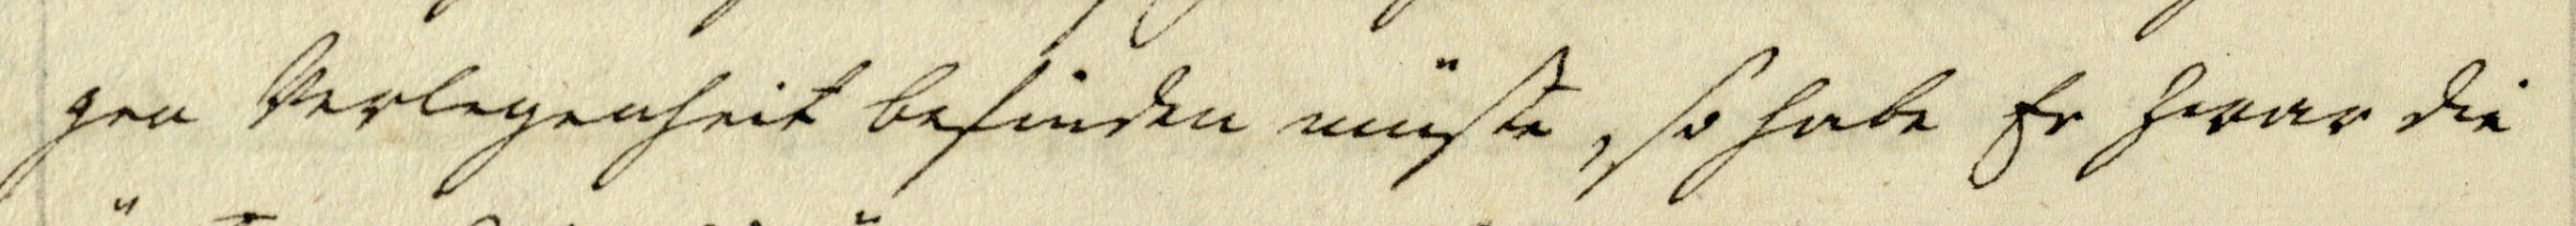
gen Verlegenheit befinden müßte, so habe Er zwar die
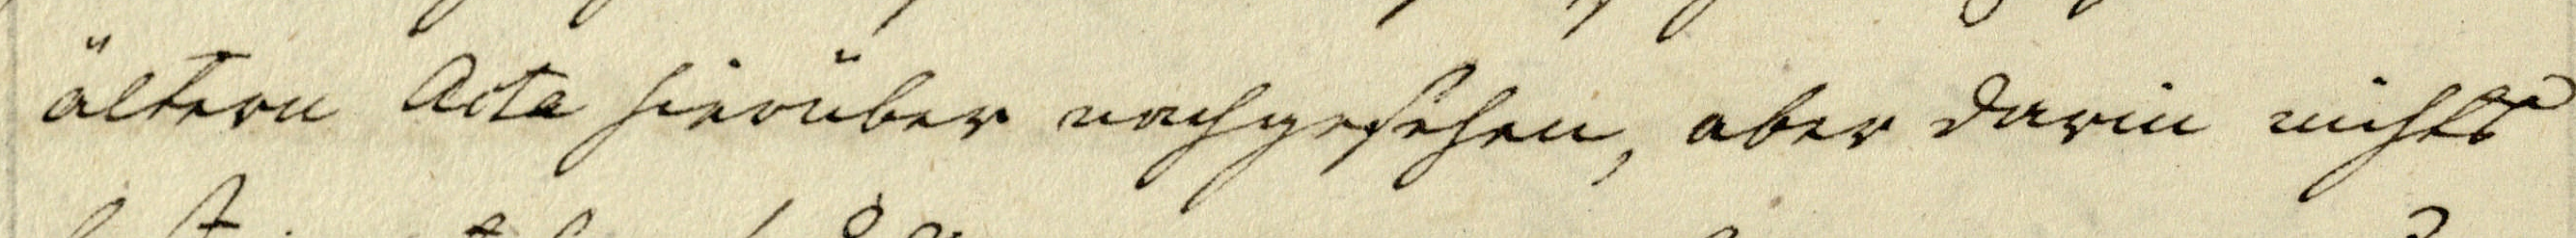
ältern Acta hierüber nachgesehen, aber darin nichts
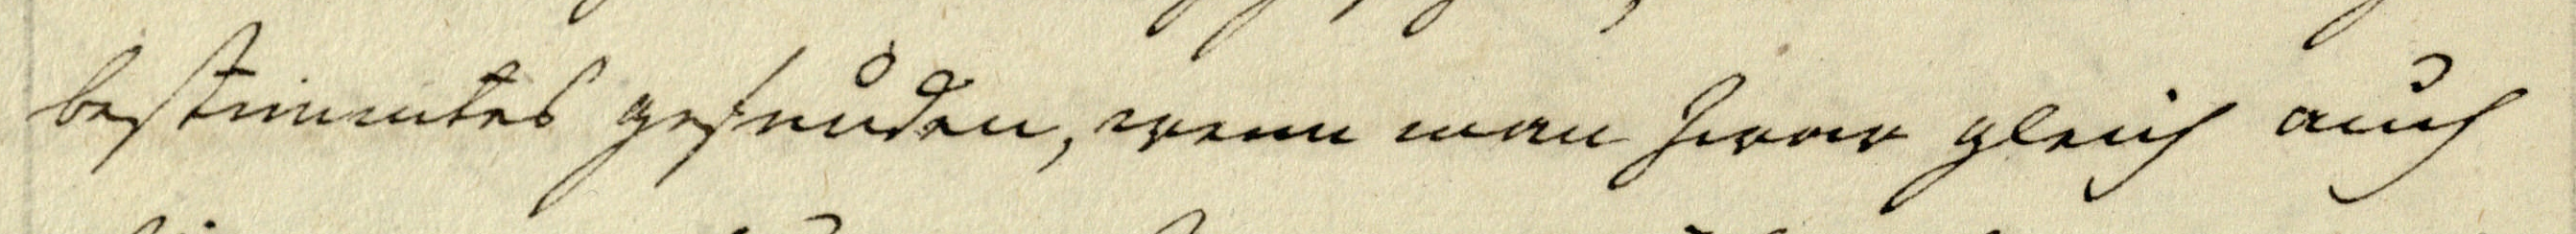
bestimmtes gefunden, wenn man zwar gleich auch
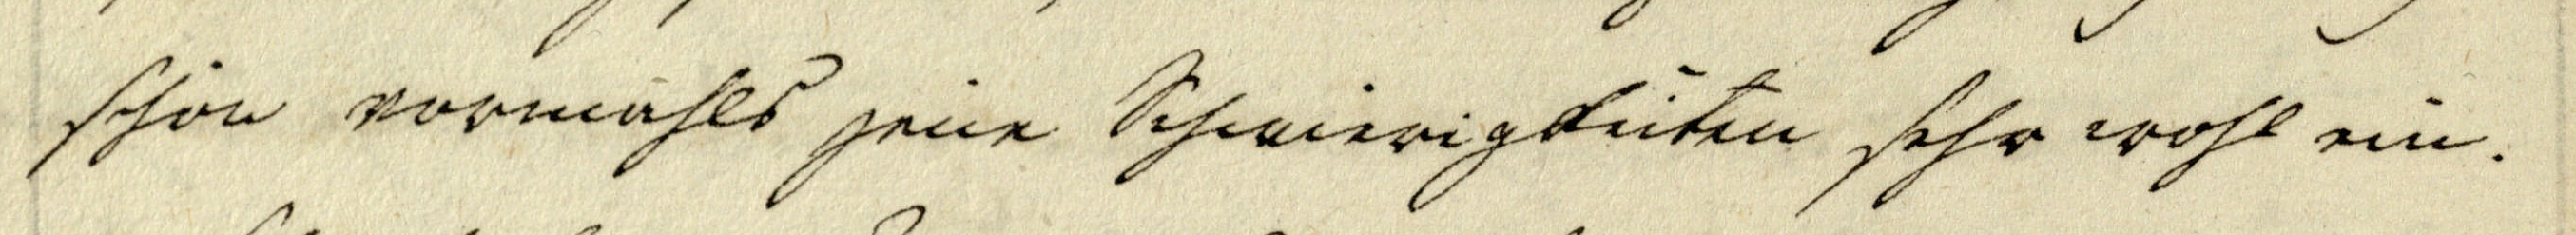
schon vormahls jene Schwierigkeiten sehr wohl ein
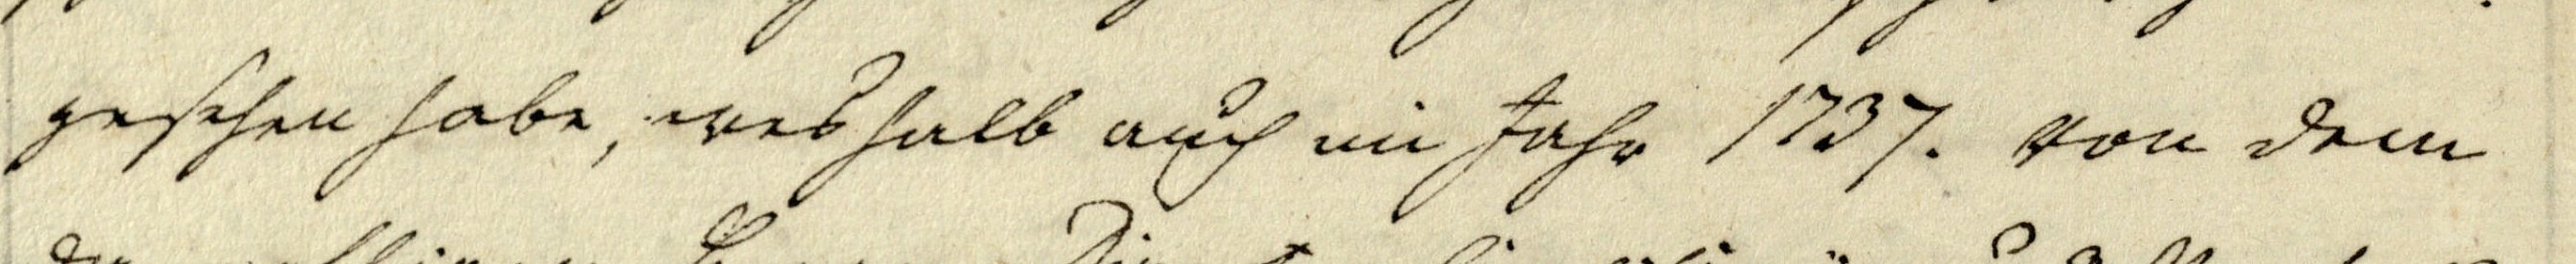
gesehen habe, weshalb auch in Jahr 1737. von dem
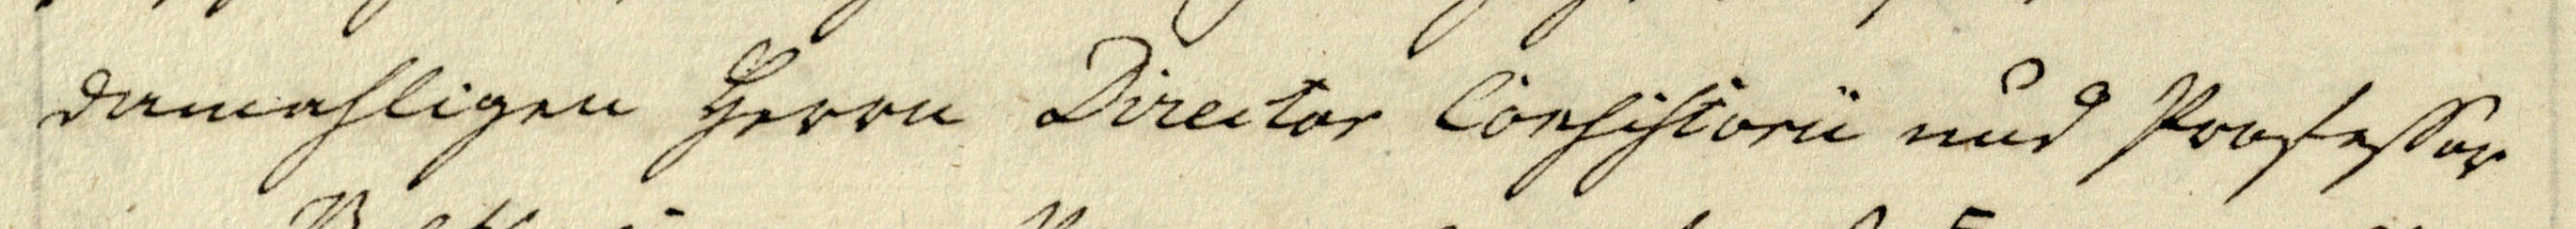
damahligen Herrn Director Consistorii und Professor
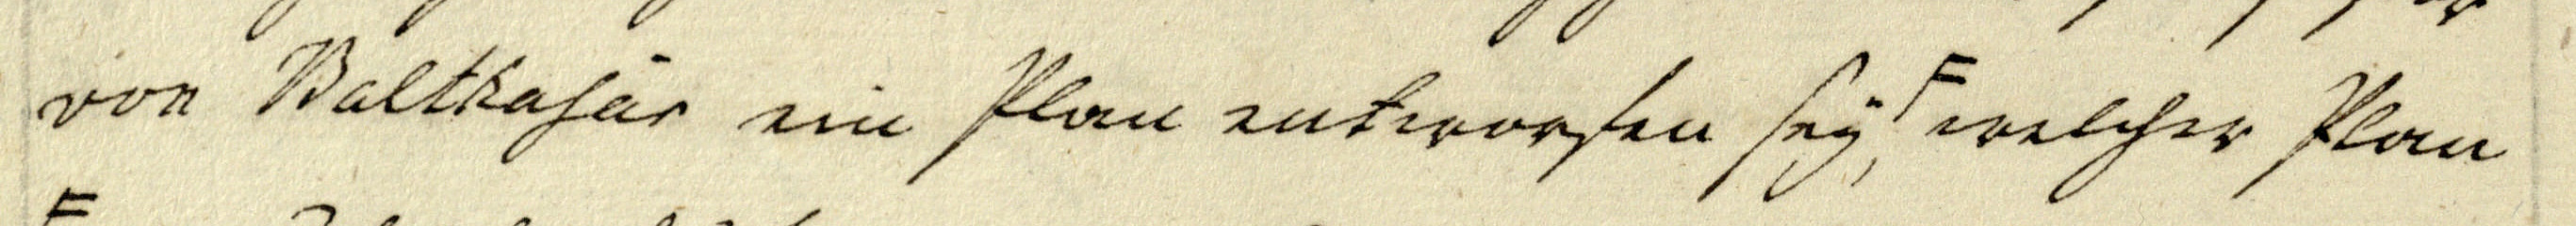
von Balthasar ein Plan entworfen seÿ, welcher Plan
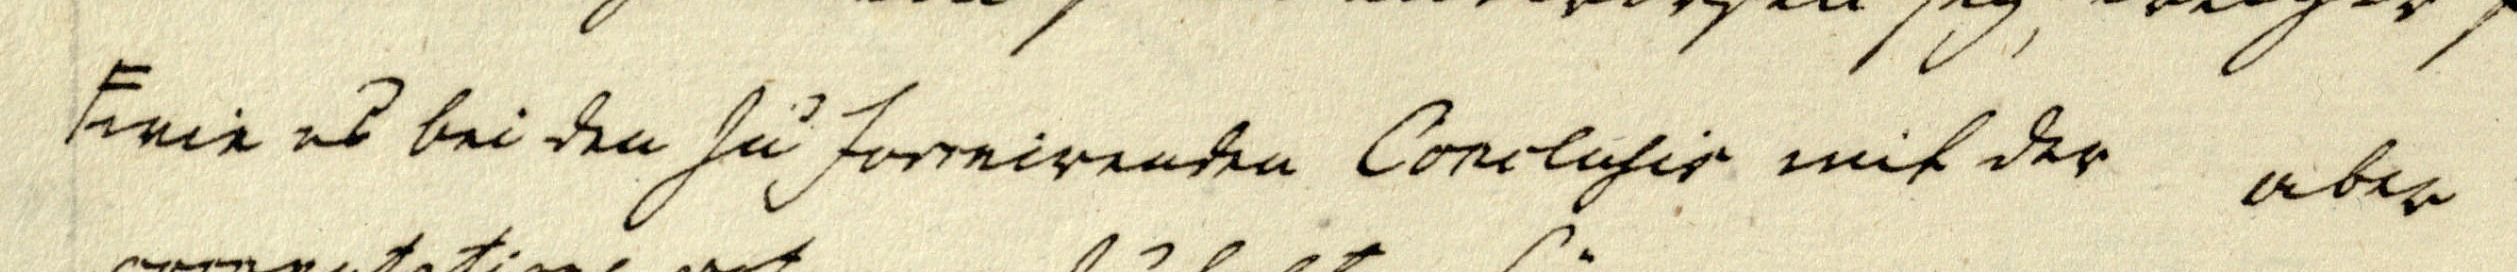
wie es bei den zu formirenden Conclusis mit der aber
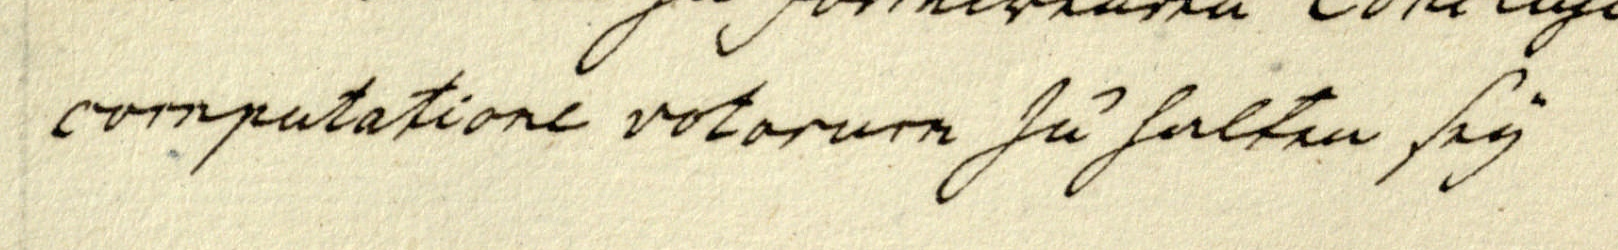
computatione votorum zu halten seÿ
